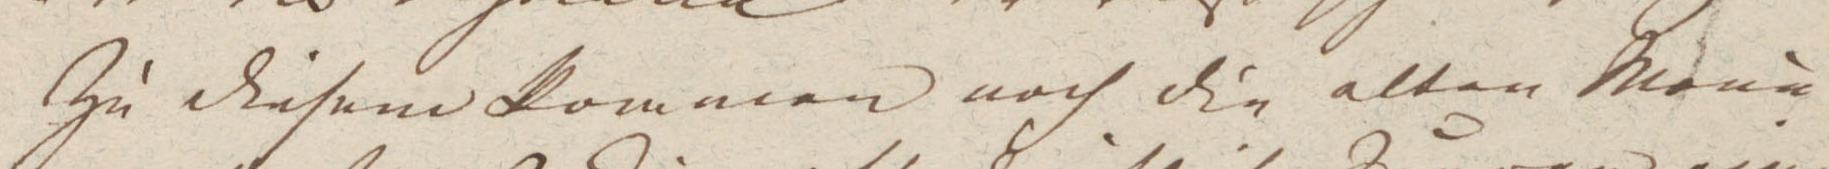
Zu diesem kommen noch die alten Monu-
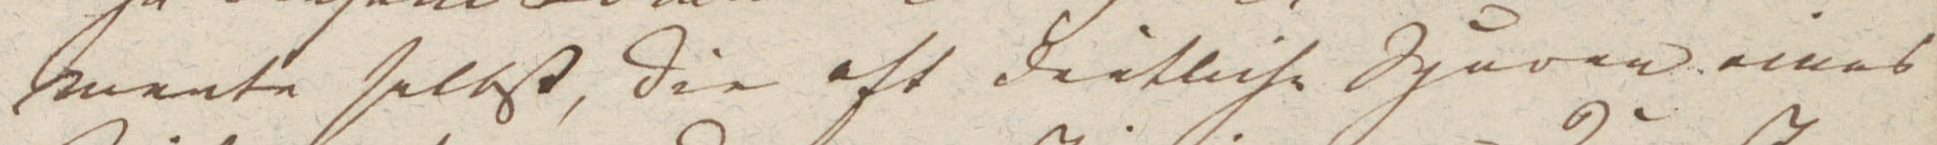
mente selbst, die oft deutliche Spuren eines
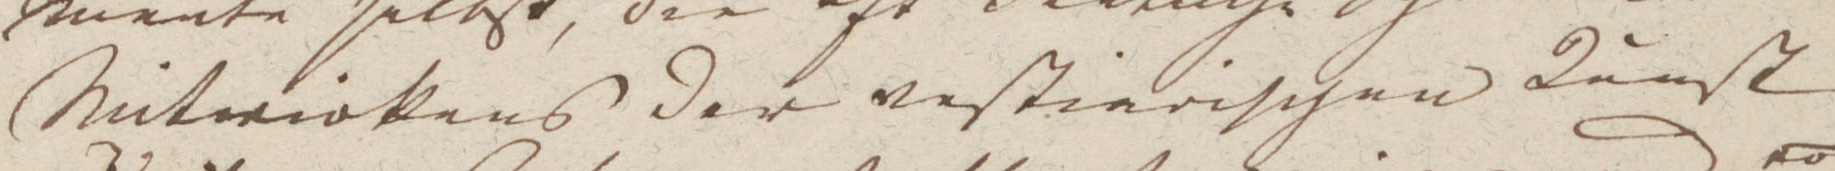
Mitwirkens der vestiarischen Kunst
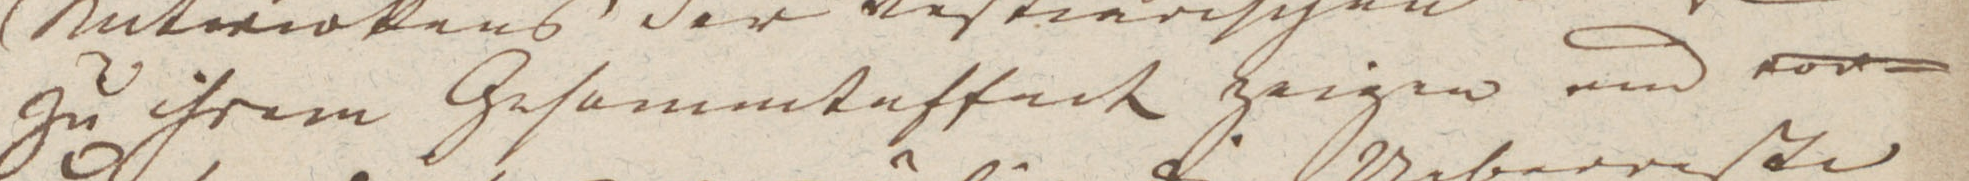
zu ihrem Gesammteffect zeigen und vor-
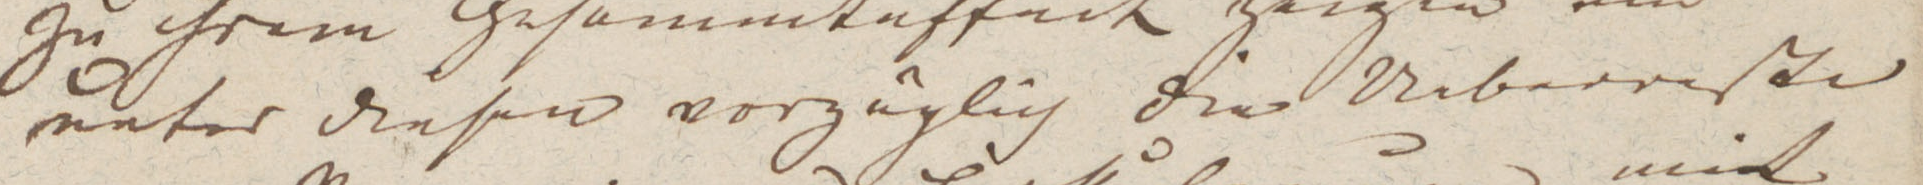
unter diesen vorzüglich die Ueberreste
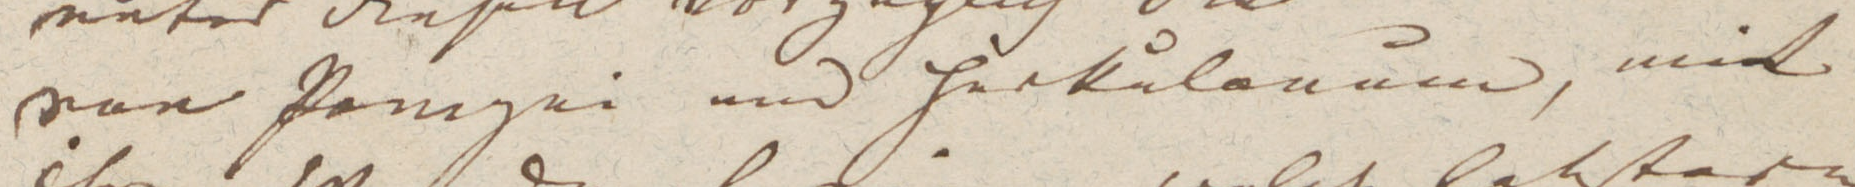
von Pompei und Herkulanum, mit
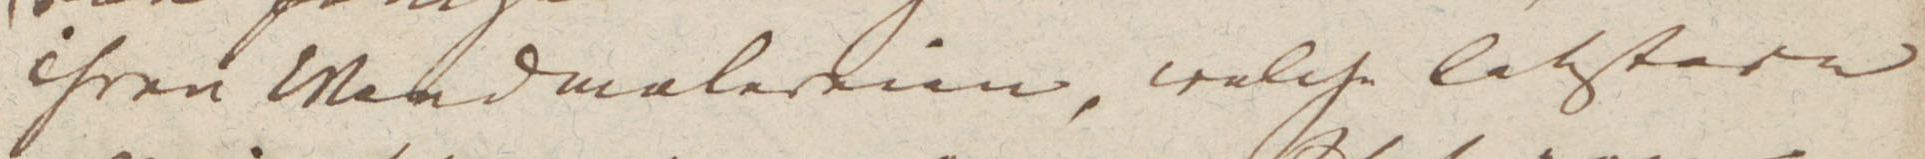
ihren Wandmalereien, welche letztere
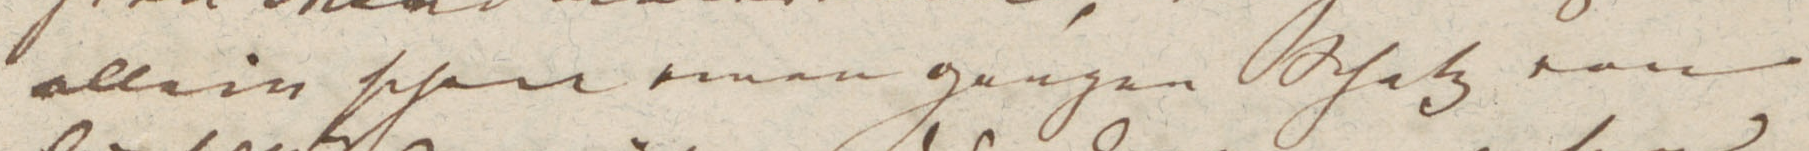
allein schon einen ganzen Schatz von
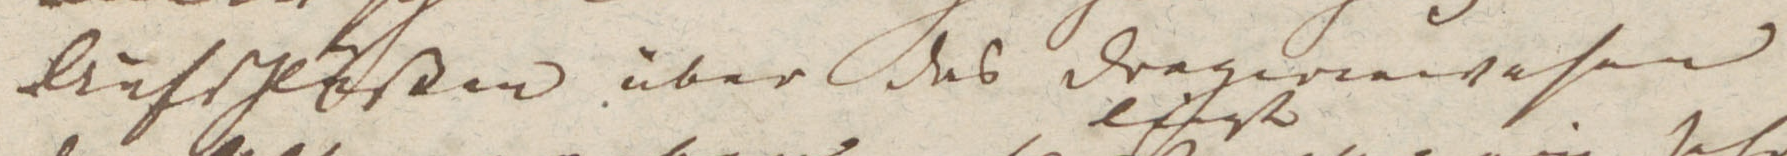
Aufschlüssen über das Draperienwesen
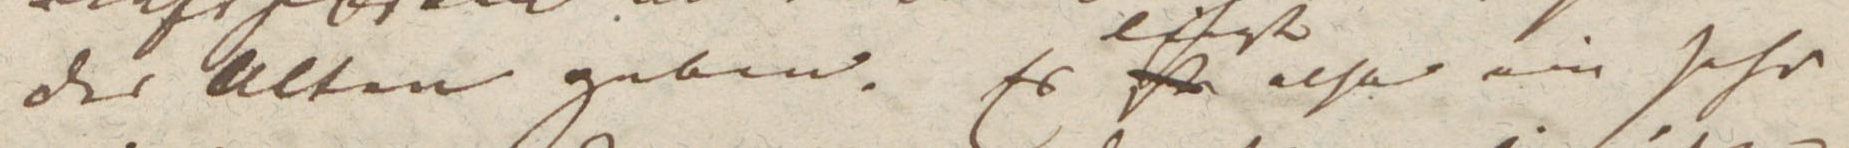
der Alten geben. Es ist liegt also ein sehr
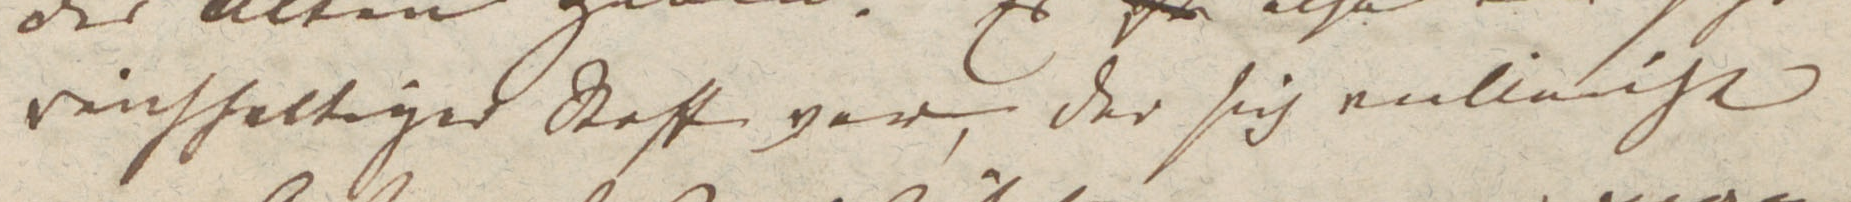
reichhaltiger Stoff vor, der sich vielleicht
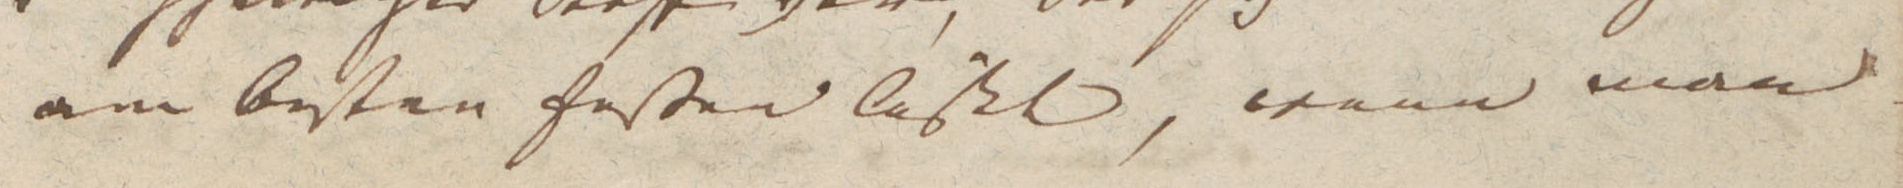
am besten fassen lässt, wenn man
